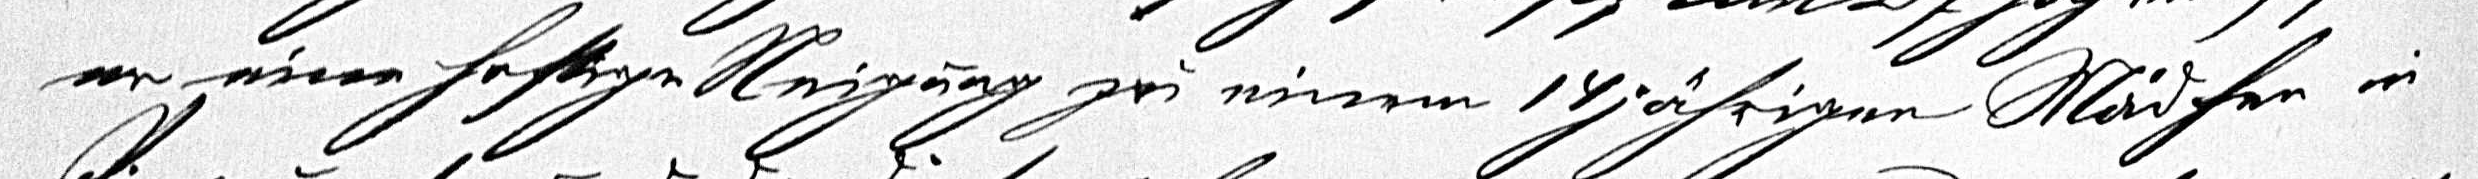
er eine festige Neigung zu einem 14jährigen Mädchen in
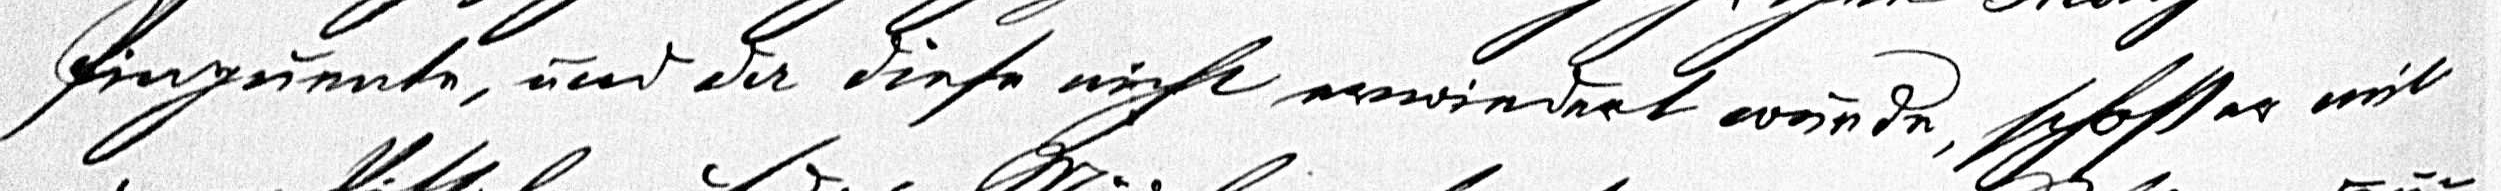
Pinguente, und da diese nicht erwiedert wurde, schloß er mit
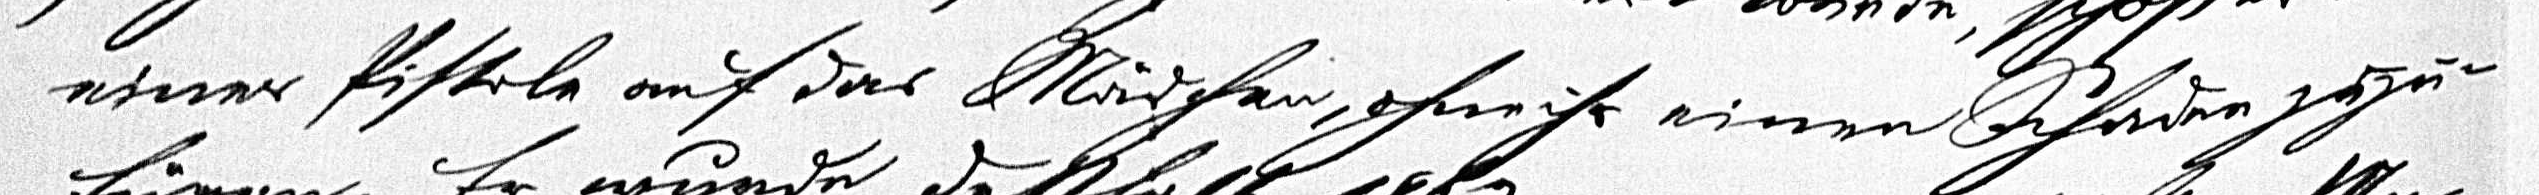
einer Pistole auf das Mädchen, ohne ihr einen Schaden zuzu¬
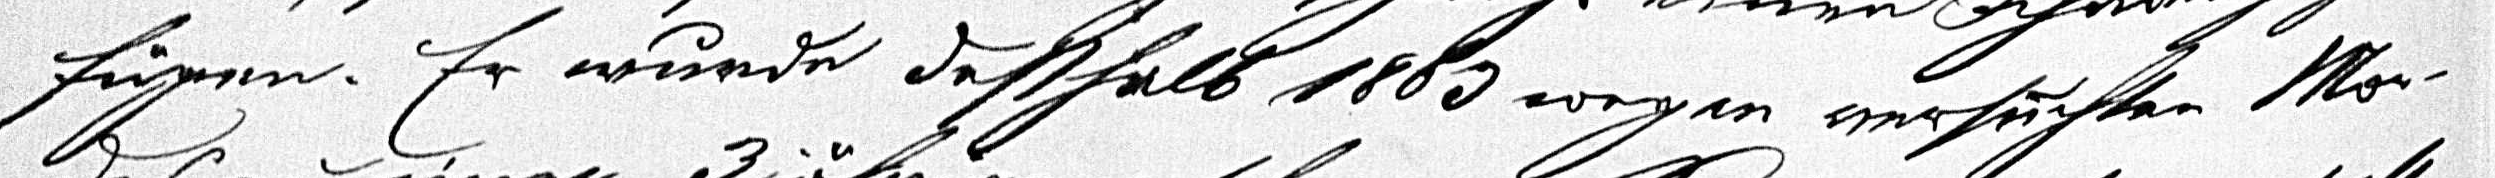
fügen. Er wurde deßhalb 1863 wegen versuchten Mor¬
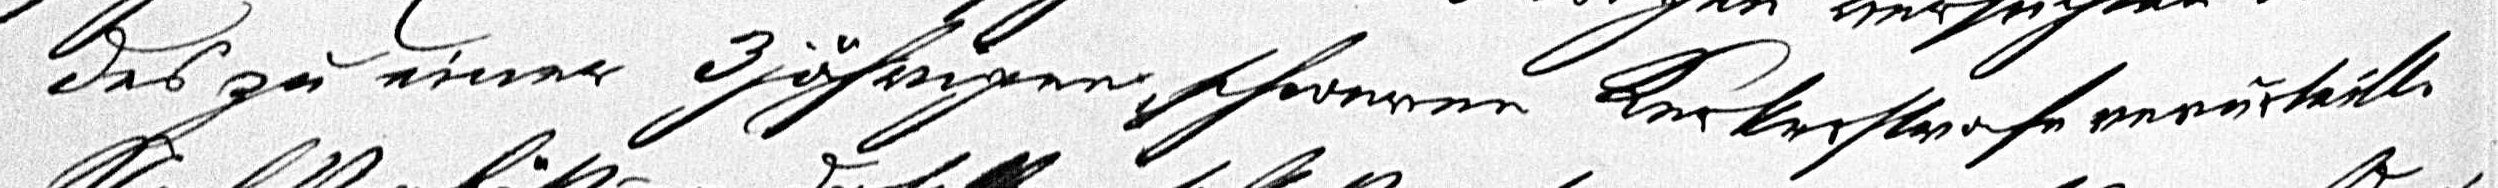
des zu einer 3jährigen schweren Kerkerstrafe verurtheilt.
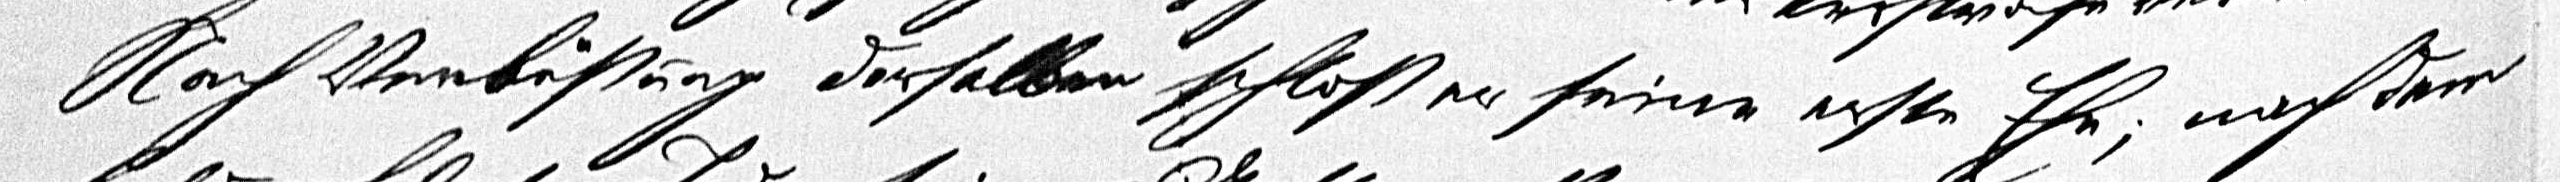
Nach Verbüßung derselben schloß er seine erste Ehe; nach dem
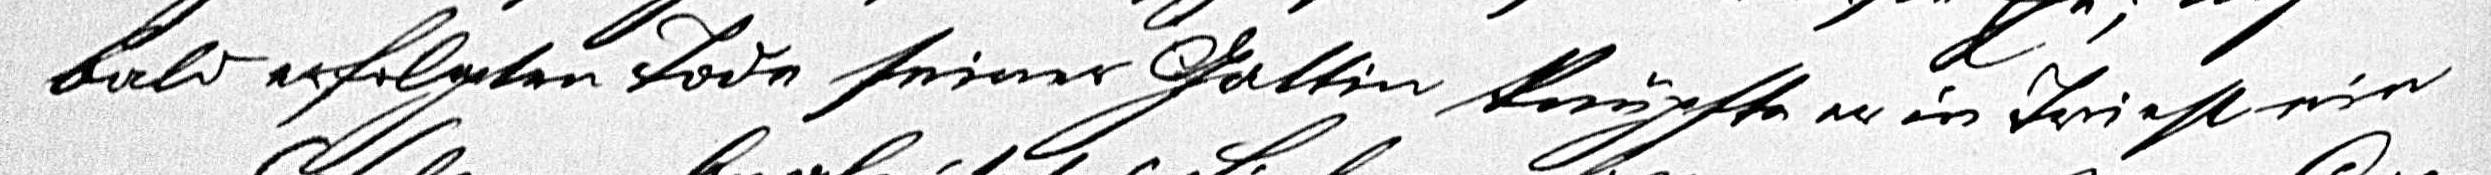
bald erfolgten Tode seiner Gattin knüpfte er in Triest ein
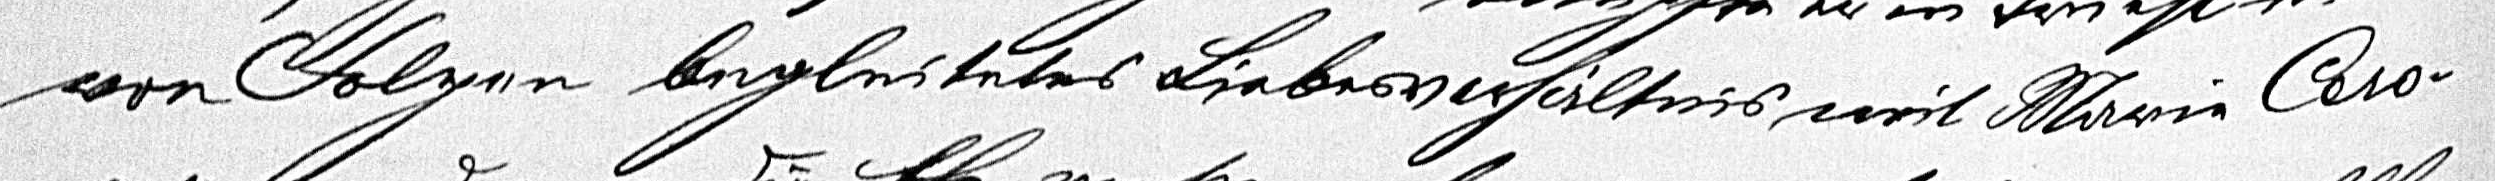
von Folgen begleitetes Liebesverhältnis mit Marie Cero¬
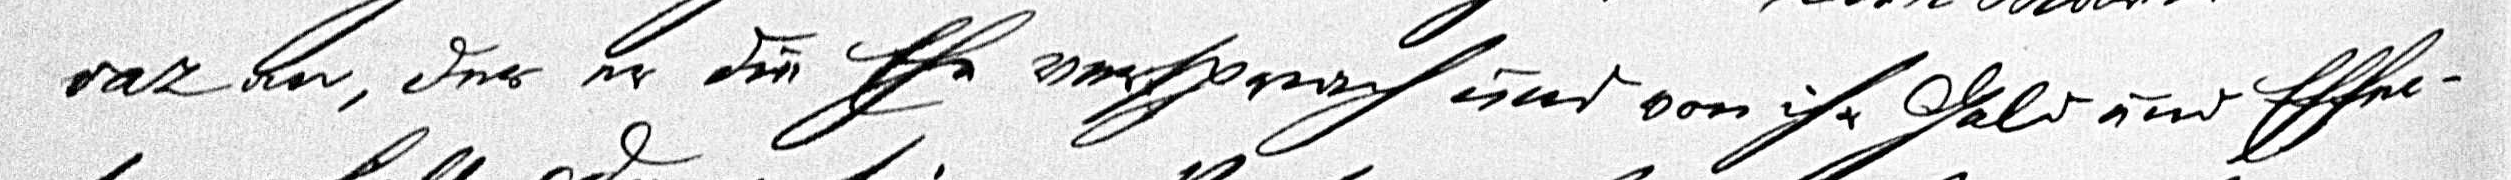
vaz an, der er die Ehe versprach und von ihr Geld und Effek¬
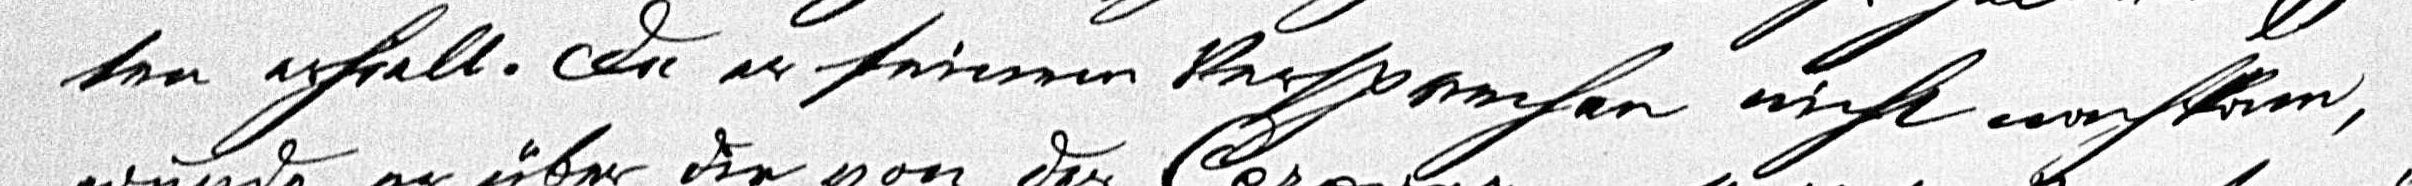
ten erhielt. Da er seinem Versprechen nicht nachkam,
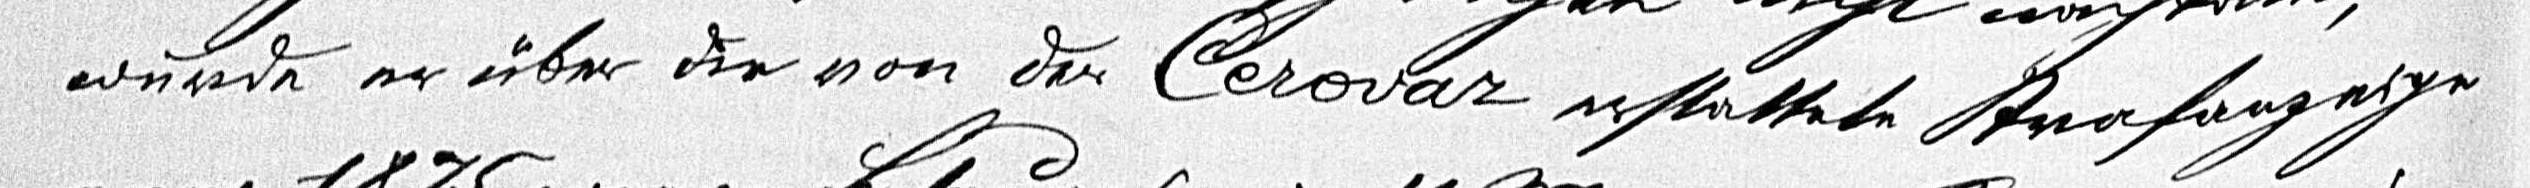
wurde er über die von der Cerovaz erstattet Strafanzeige
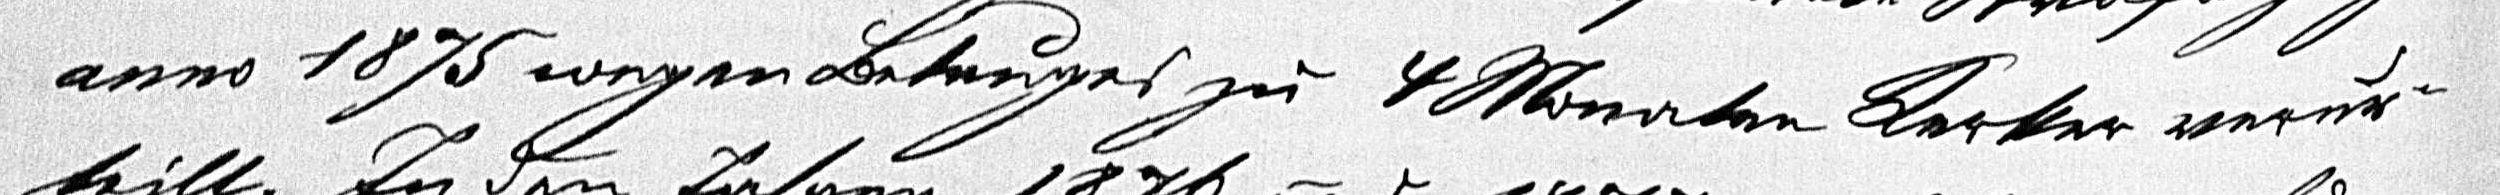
anno 1875 wegen Betruges zu 4 Monaten Kerker verur¬
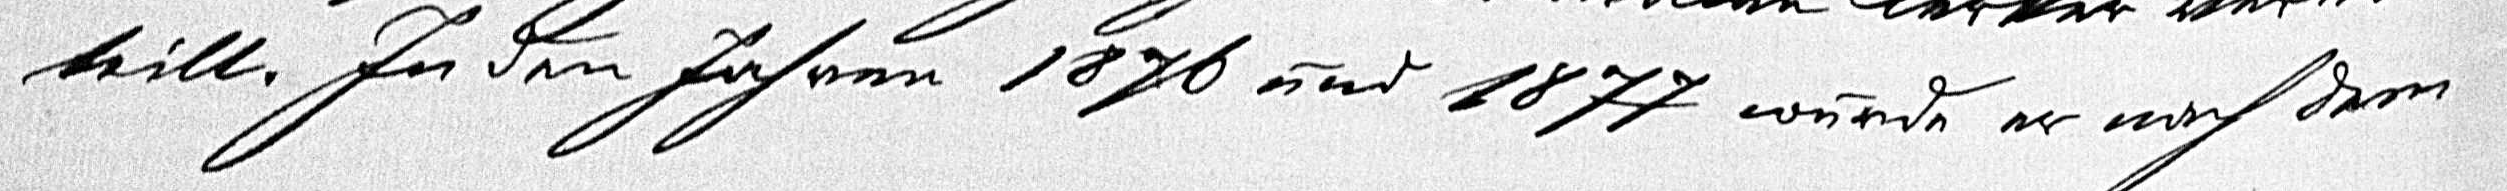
teilt. In den Jahren 1870 und 1877 wurde er nach dem
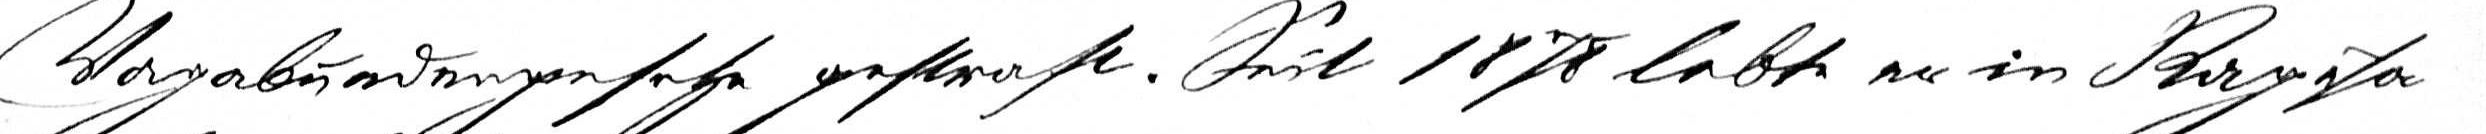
Vagabundengesetze gestraft. Seit 1878 lebte er in Ragusa
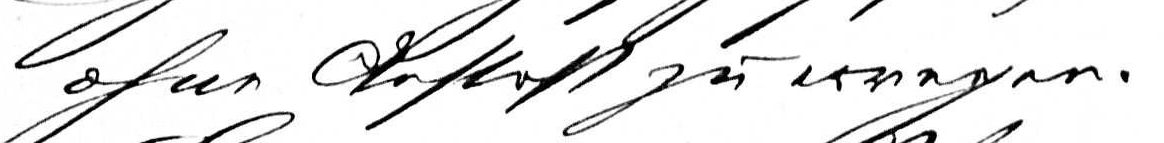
ohne Anstoß zu erregen.
